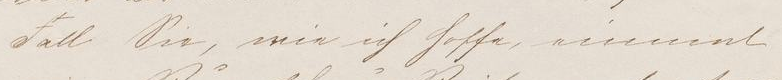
Fall Sie, wie ich hoffe, einmal
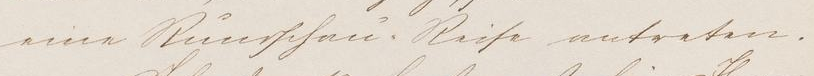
eine Rundschau-Reise antreten.
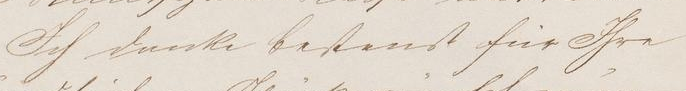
Ich danke bestens für Ihre
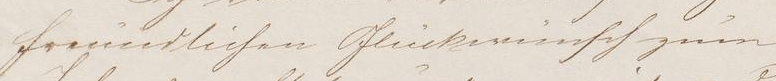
freundlichen Glückwünsch zum
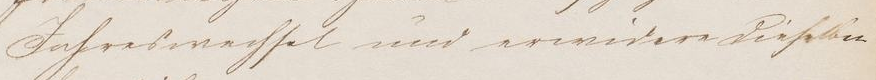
Jahreswechsel und erwidere dieselben
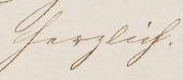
herzlich
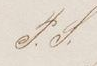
P. S.
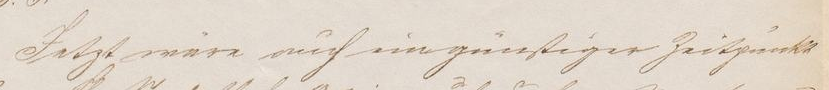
Jetzt wäre auch ein günstiger Zeitpunkt
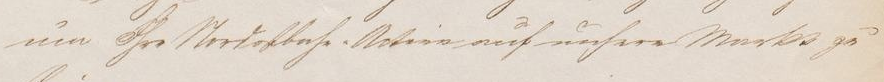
um Ihre Nordostbahn-Actien auf unsern Markt zu
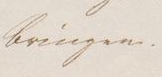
bringen.
